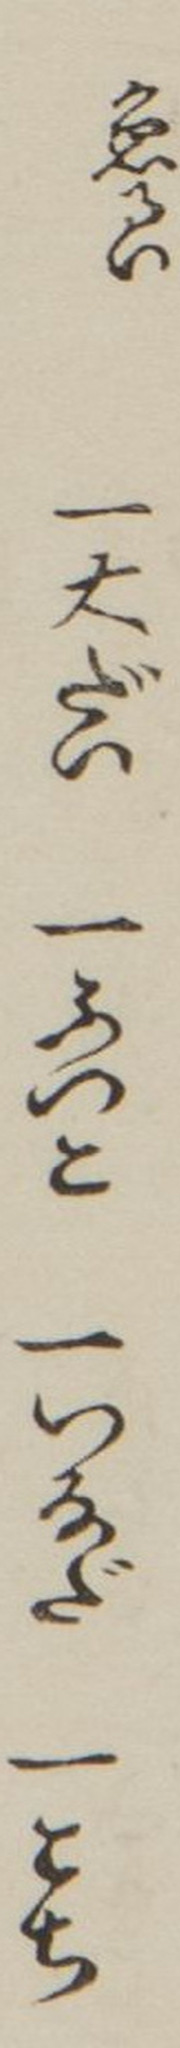魚るい一大だい一ふつこ一いなだ一こち
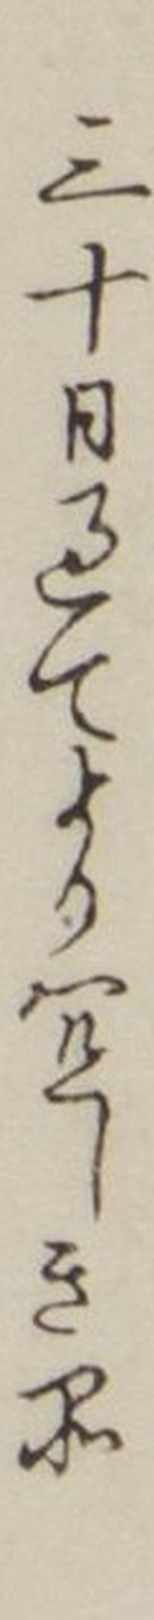三十日過てより宜しき品
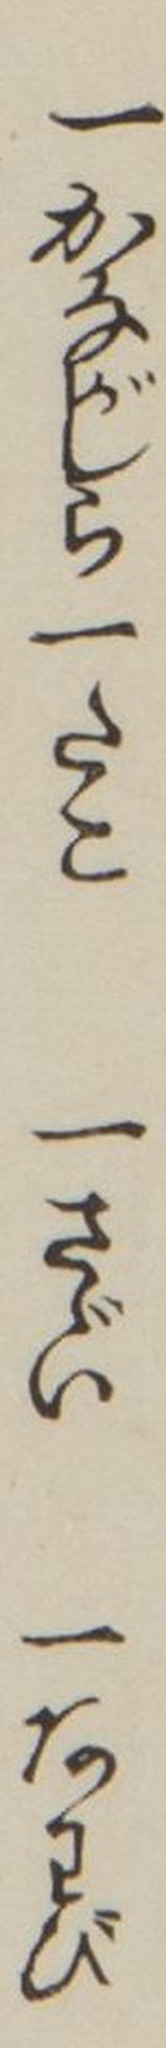一かながしら一たこ一さざい一あわび
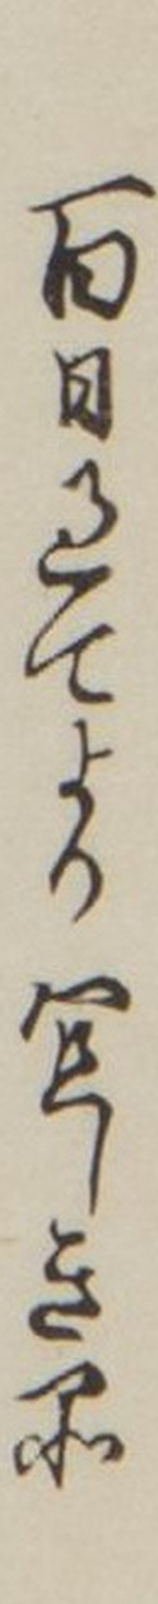百日過てより宜しき品
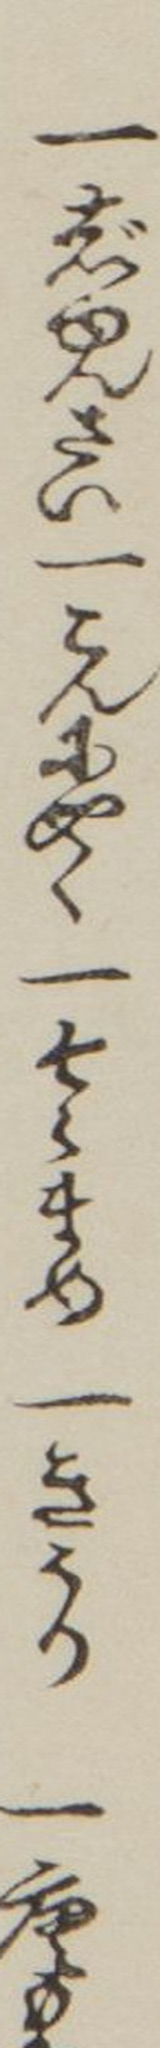一じゆんさい一こんにやく一そらまめ一きうり一唐もろこし
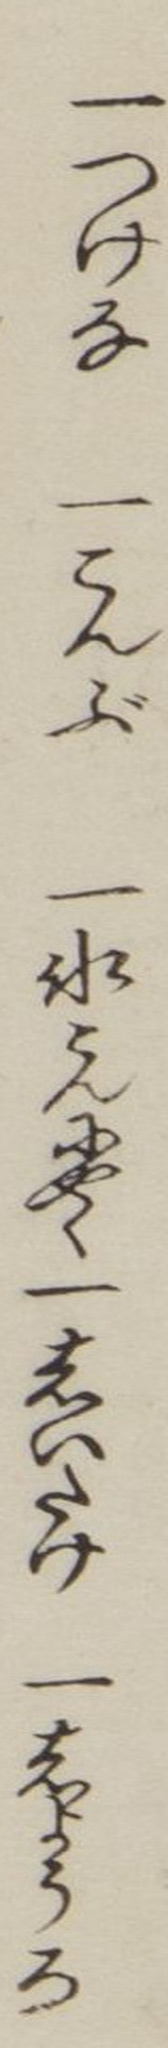一つけな一こんぶ一水こんにやく一しいたけ一しようろ
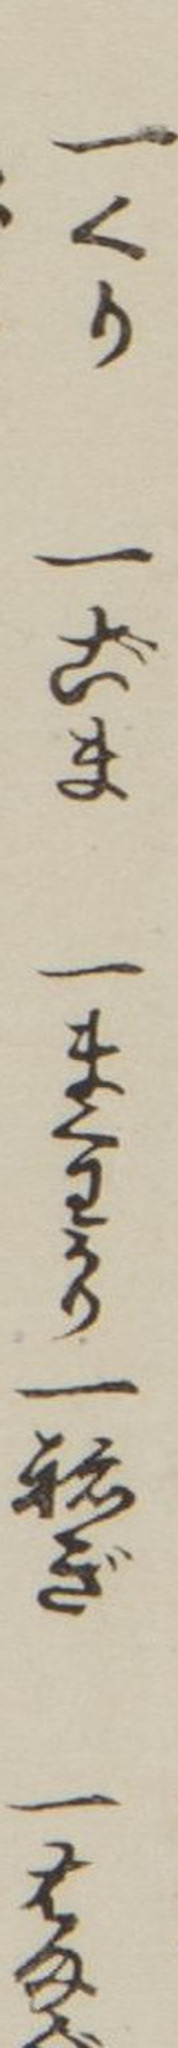一くり一ごま一まくわうり一ねぎ一はまぐり
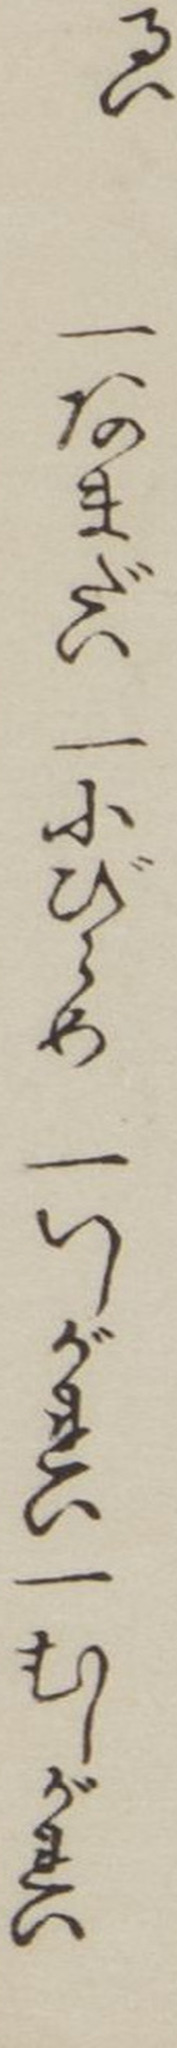魚るい一なまだい一小びらめ一いしがれい一むしがれい

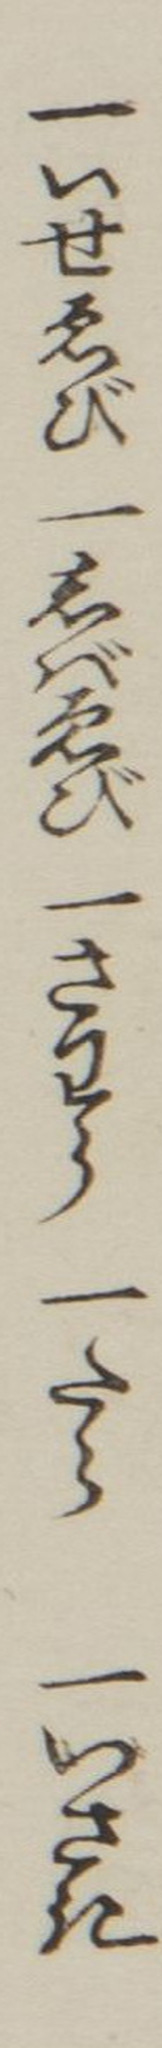一いせゑび一しばゑび一さわら一たら一いさき
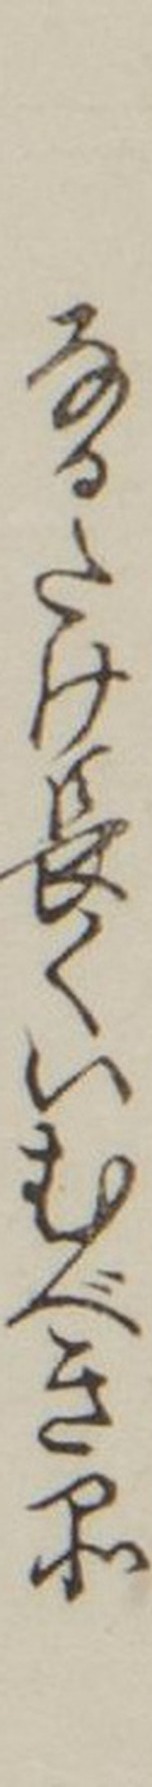なるたけ長くいむべき品
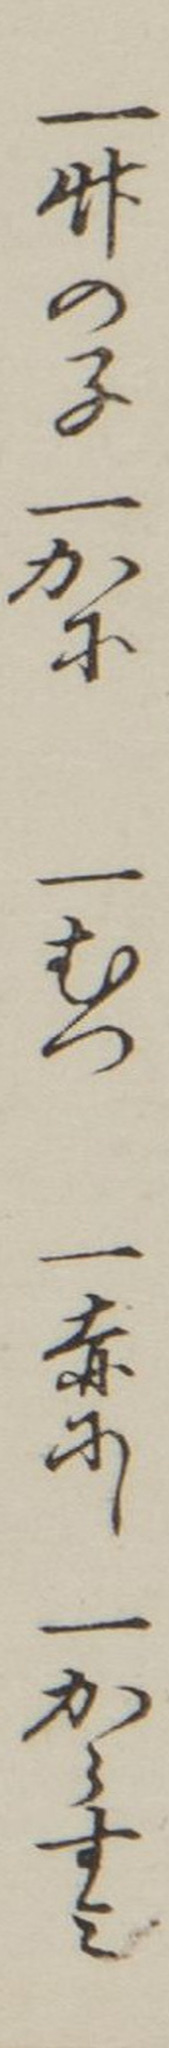一竹の子一かに一むつ一赤にし一からすみ
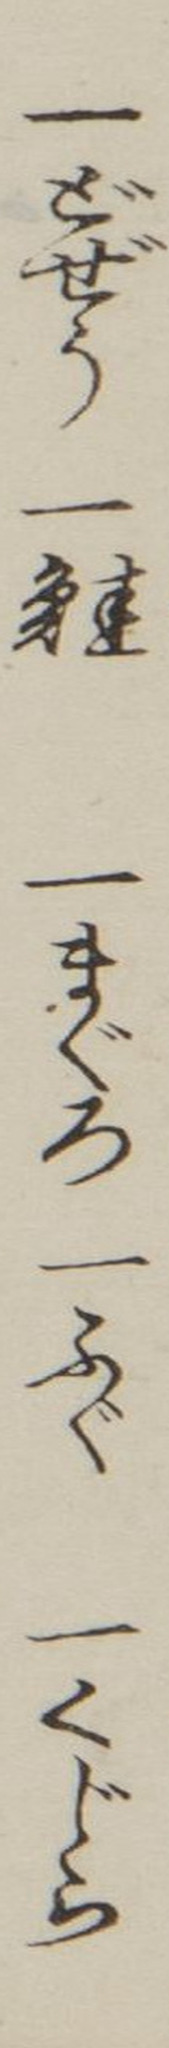一どぜう一鮭一まぐろ一ふぐ一くじら
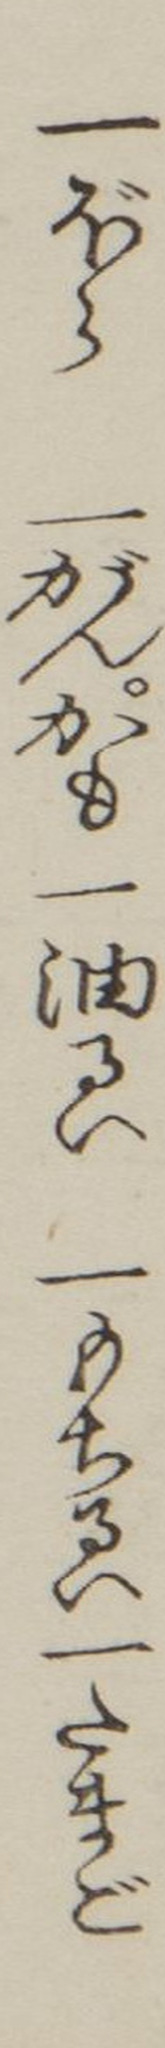一ぼら一がん。かも一油るい一もちるい一たまご
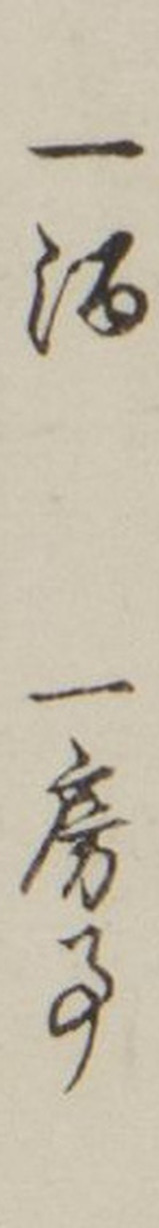一酒一房事
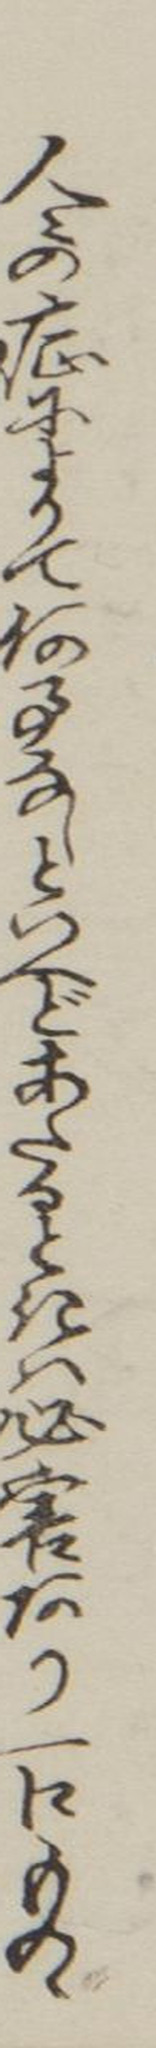人々の症によりて何事なしといへどあたるときには必害あり一口ものゝ
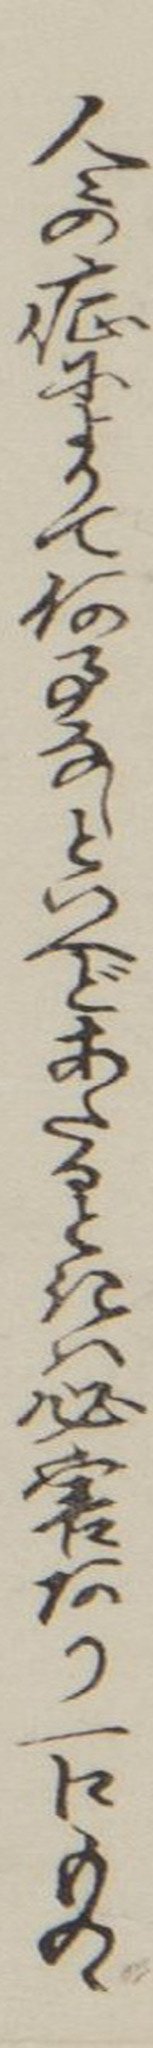人々の症によりて何事なしといへどあたるときには必害あり一口ものゝ
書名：はしか毒いみ心得艸
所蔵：あいおいニッセイ同和損保株式会社
